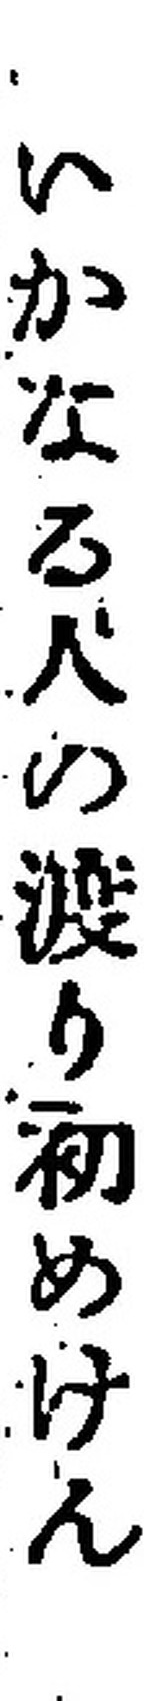いかなる人の渡り初めけん
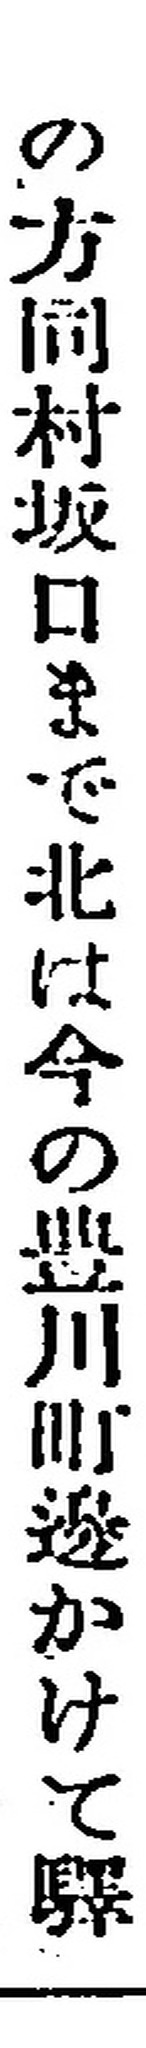の方同村坂口まで北は今の豊川町辺かけて駅
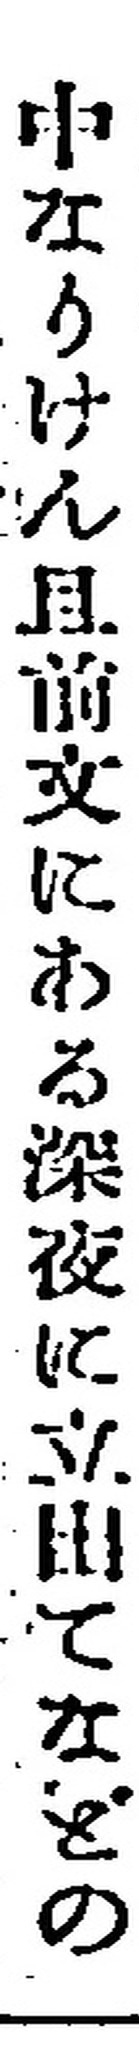中なりけん且前文にある深夜に立出でなどの
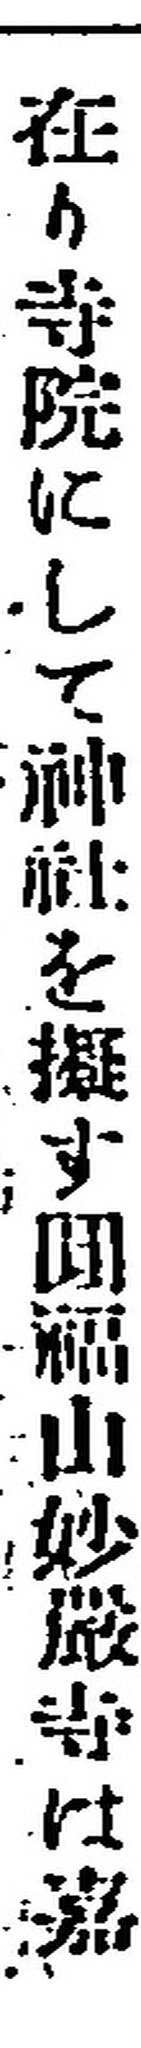在り寺院にして神社を擬す円福山妙厳寺は嘉
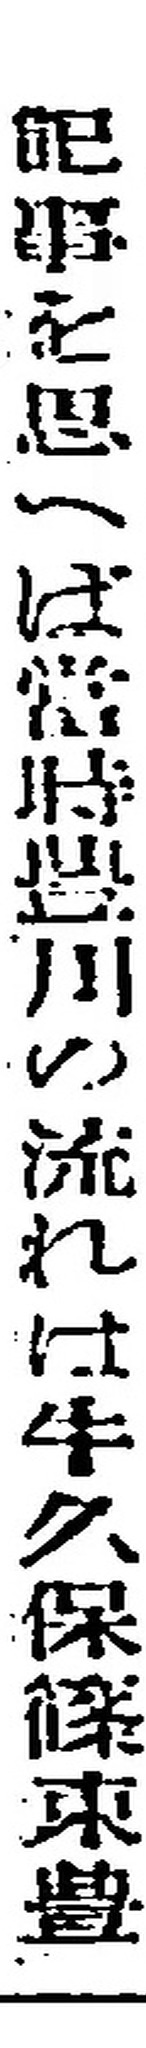記事を思へば当時豊川の流れは牛久保篠束豊
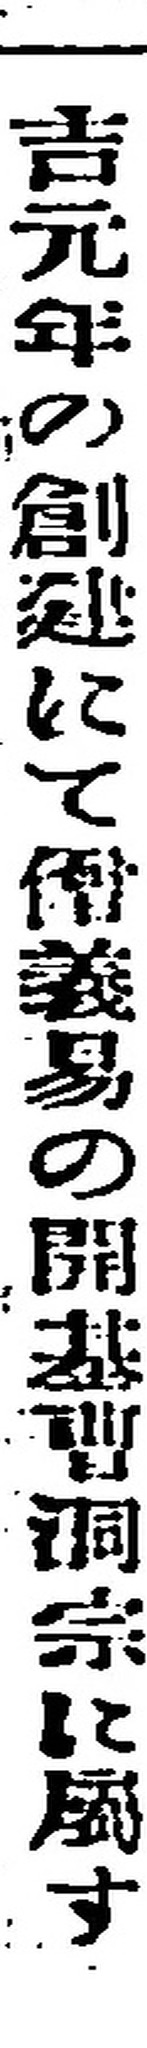吉元年の創建にて僧義易の開基曹洞宗に属す
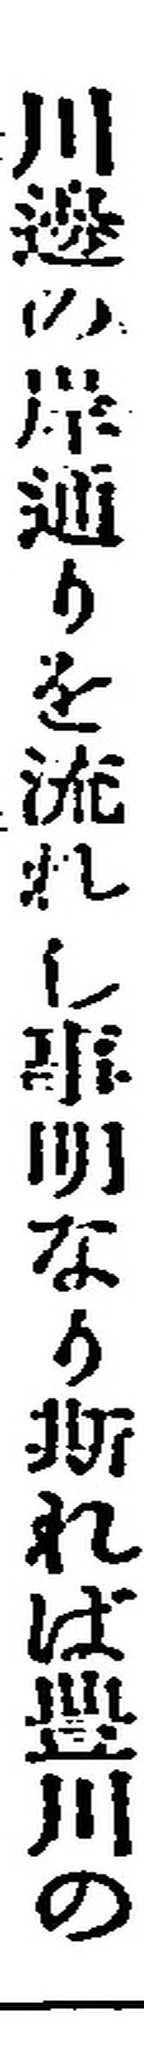川辺の岸通りを流れし事明なり斯れば豊川の
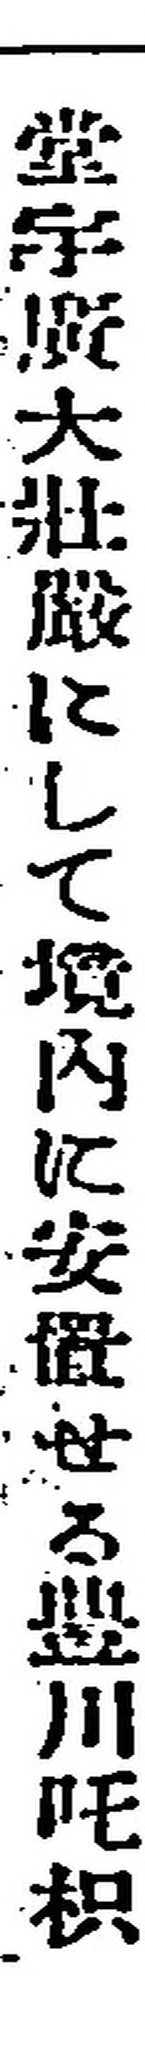堂宇広大壮厳にして境内に安置せる豊川吒枳
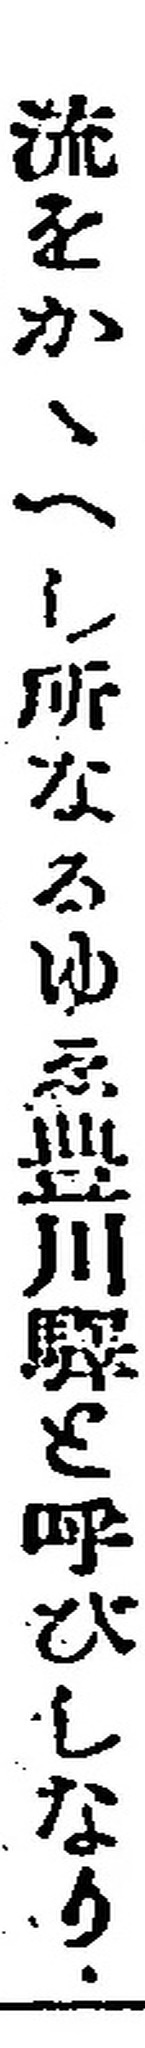流をかゝへし所なるゆゑ豊川駅と呼びしなり
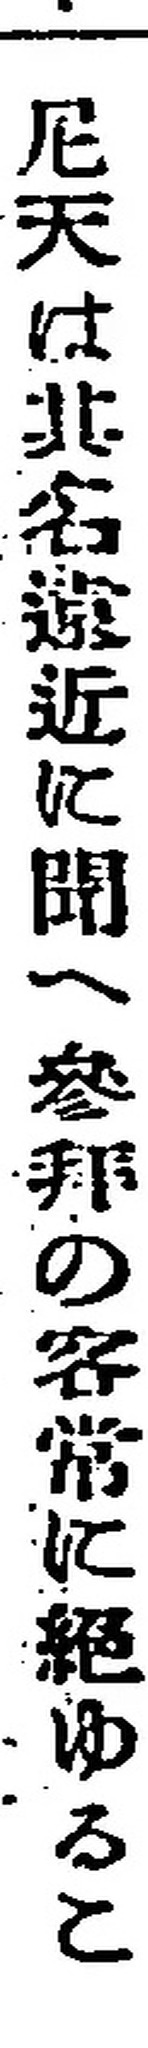尼天は其名遠近に聞へ参拝の客常に絶ゆるこ
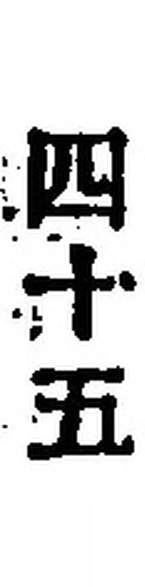四十五

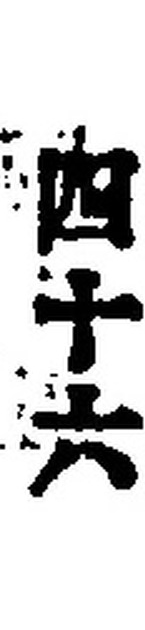四十六
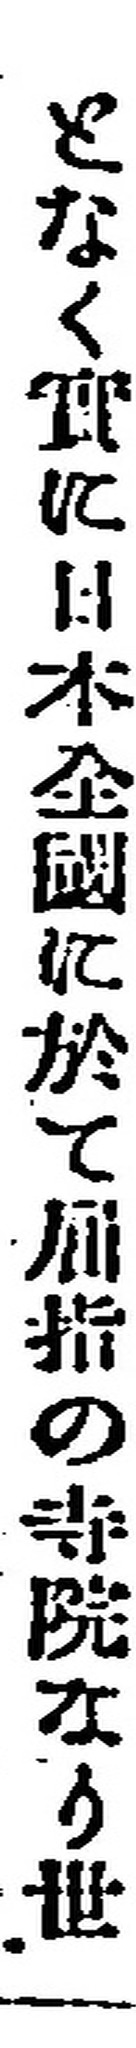となく実に日本全国に於て屈指の寺院なり世
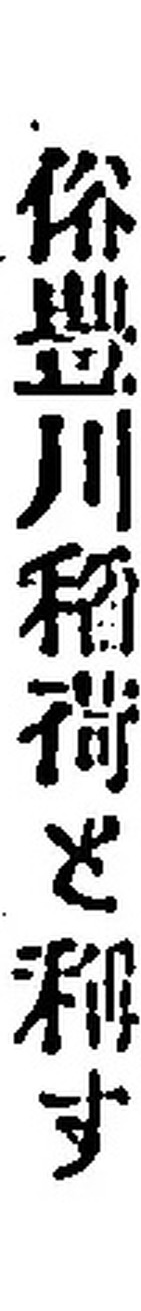俗豊川稲荷と称す
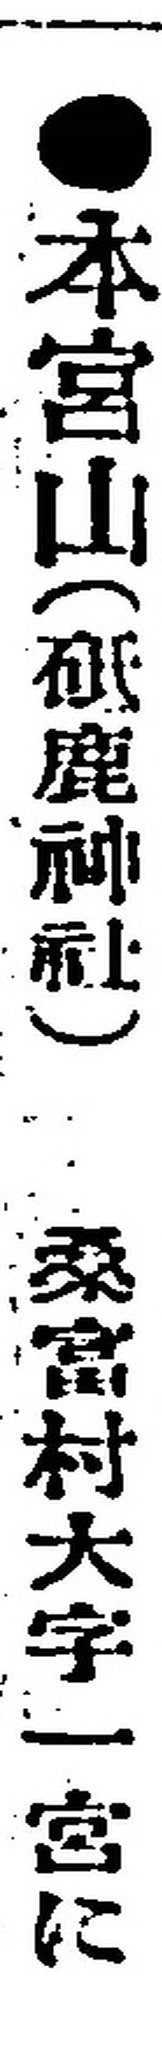●本宮山(砥鹿神社)桑富村大字一宮に
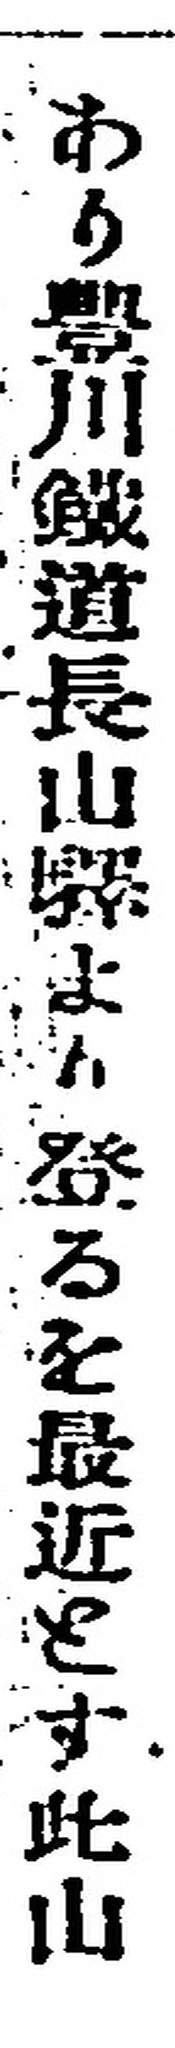あり豊川鉄道長山駅より登るを最近とす此山
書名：東参名勝案内
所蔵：国立国会図書館 National Diet Library, JAPAN
